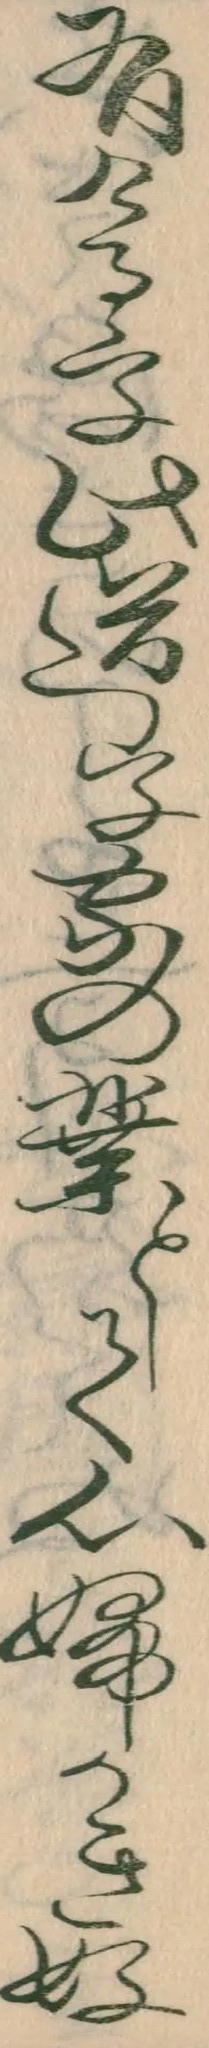有けるを此道を家の業として心ふかき好
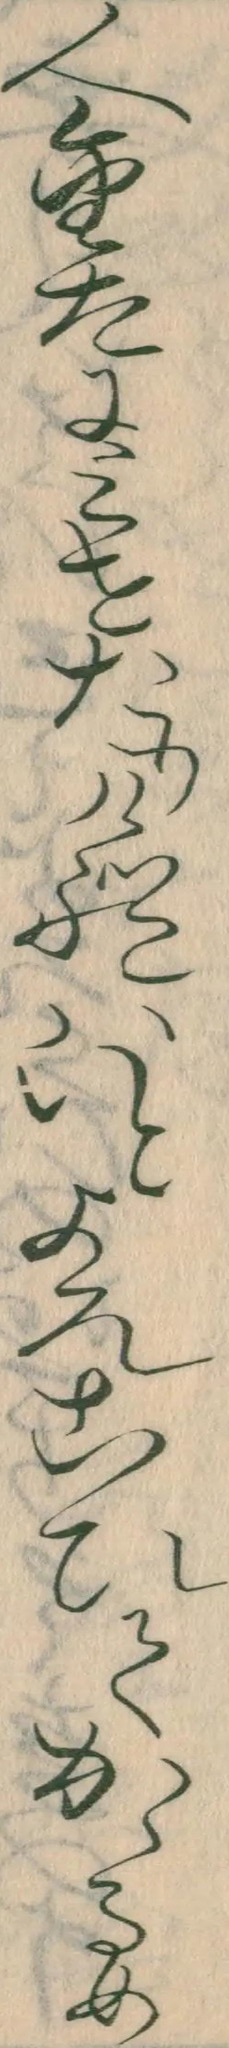人重たにみせたりけれはいとよろこひてかゝるめ
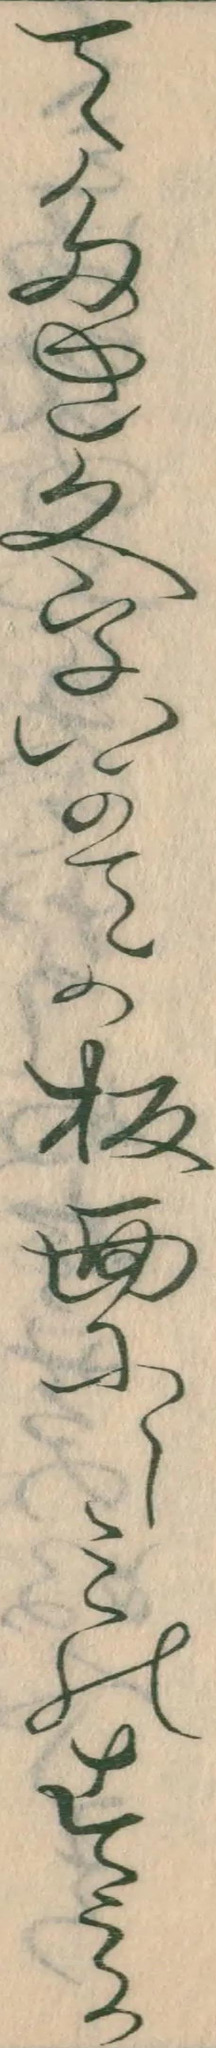てたき文をいかてか板面にしみのすみか
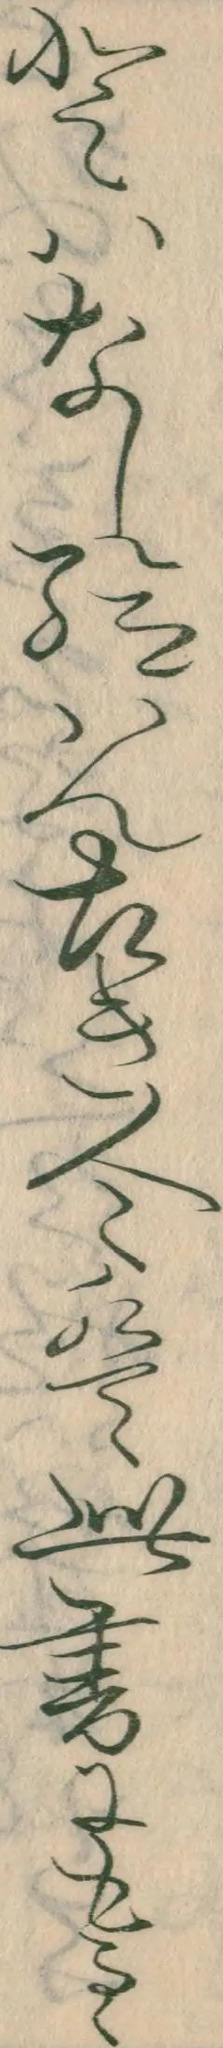とはなし給はん古き人々は此書にもるゝ
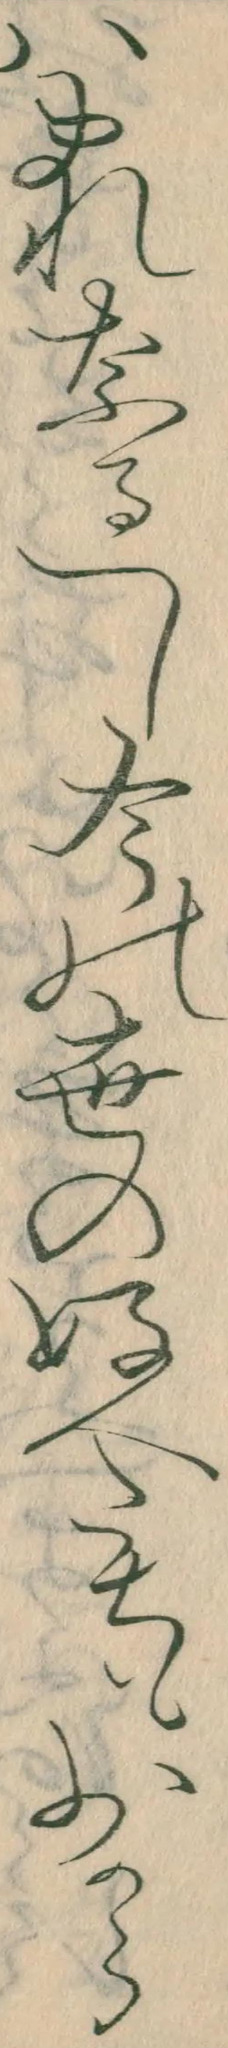はまれなるへし今の世の好人たちも少から
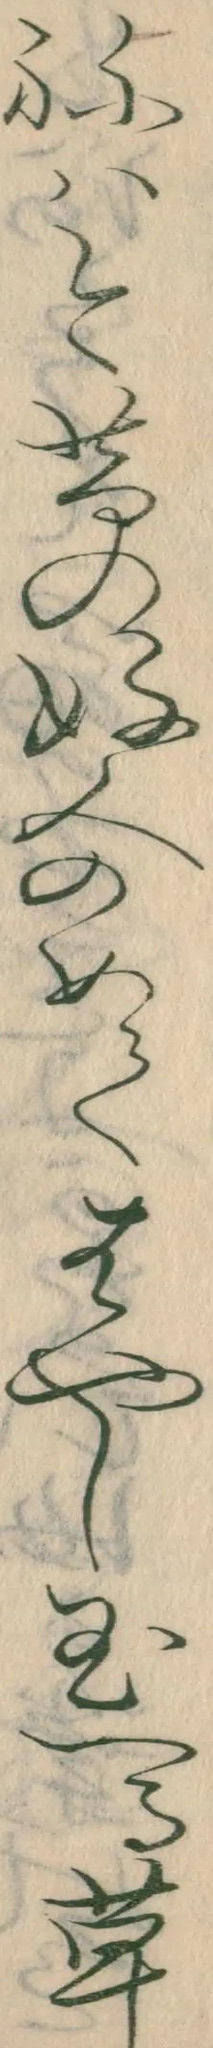ねは今昔の好人のめてはやし玉へる草
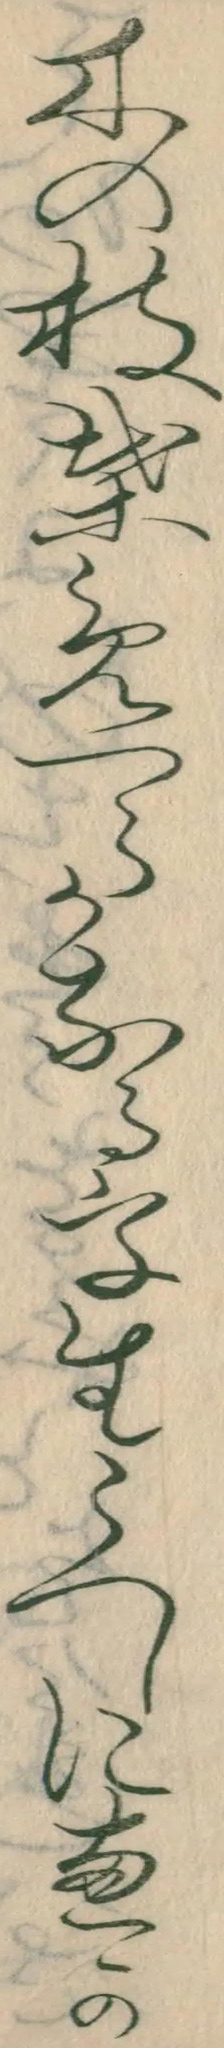木の枝葉めつらかなるを生うつしにゑか
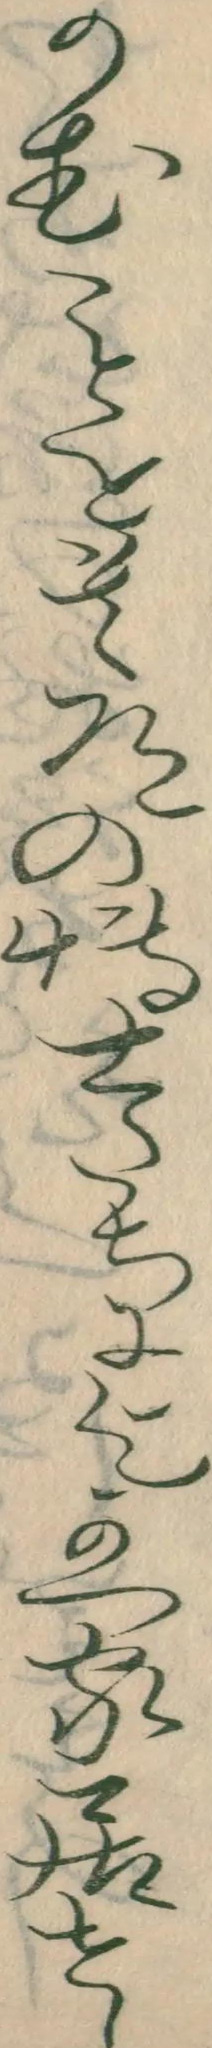かむことを其道の博士たちに乞かつ家居せし

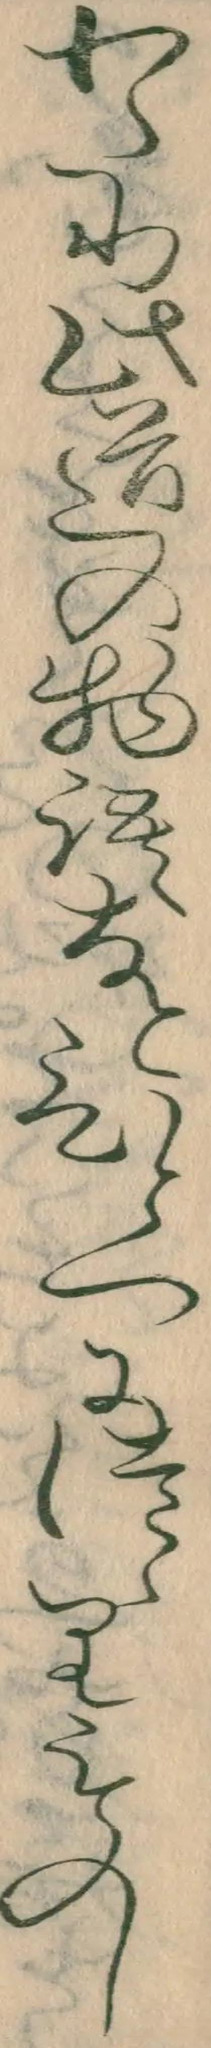わたり此道の物語なとひとつにつゝりものし
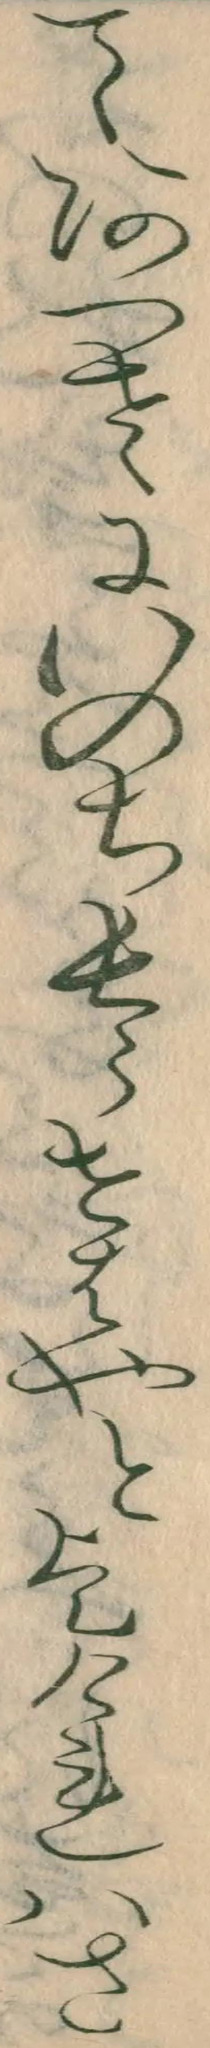てあつさにいのち長らせはやと乞けれはさ
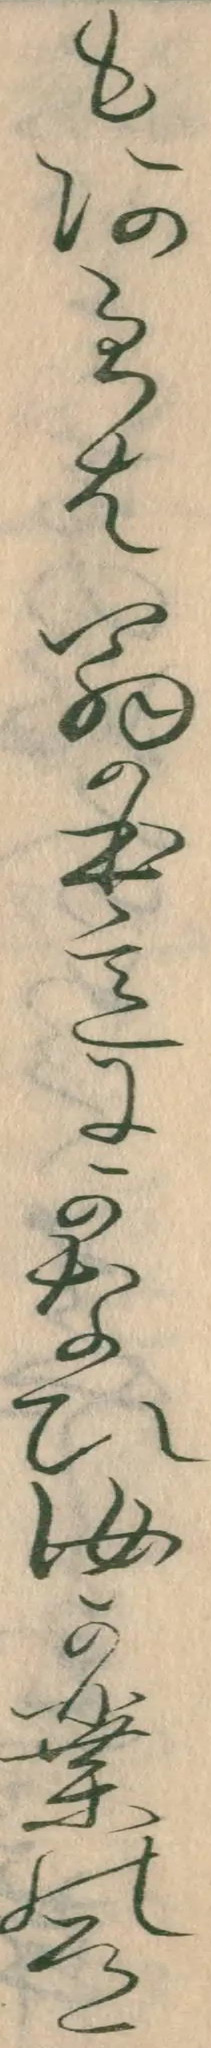もあらは翁の本意にかなひ汝か業の道
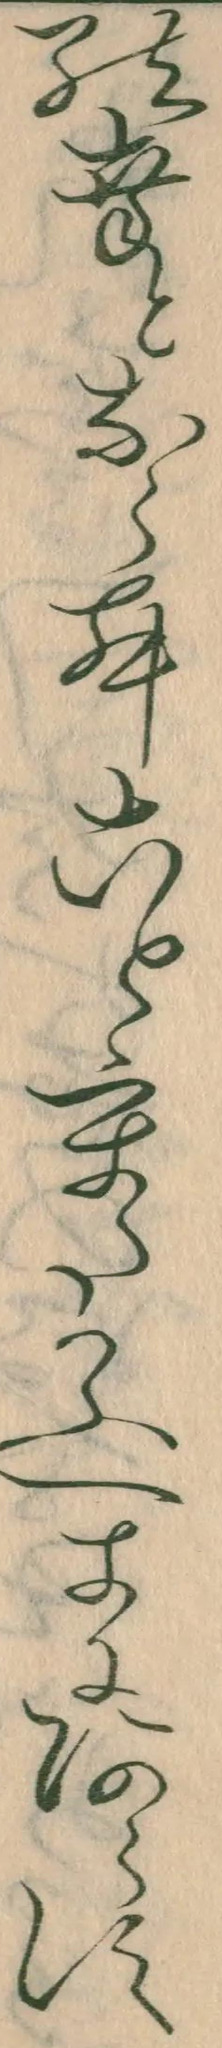の幸とならむことうたかふへきにあらす
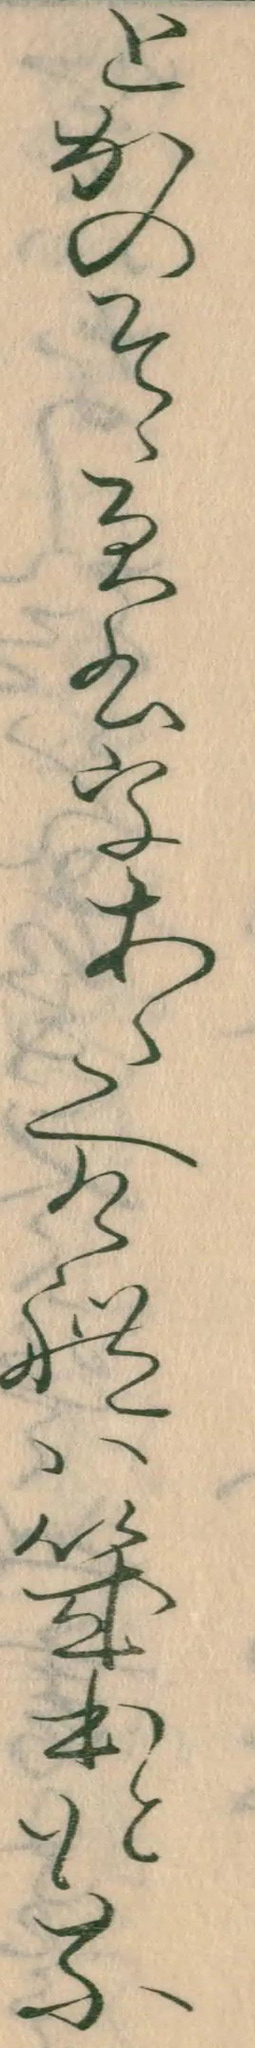とかのそゝら書をあたへけれは幾ほともな
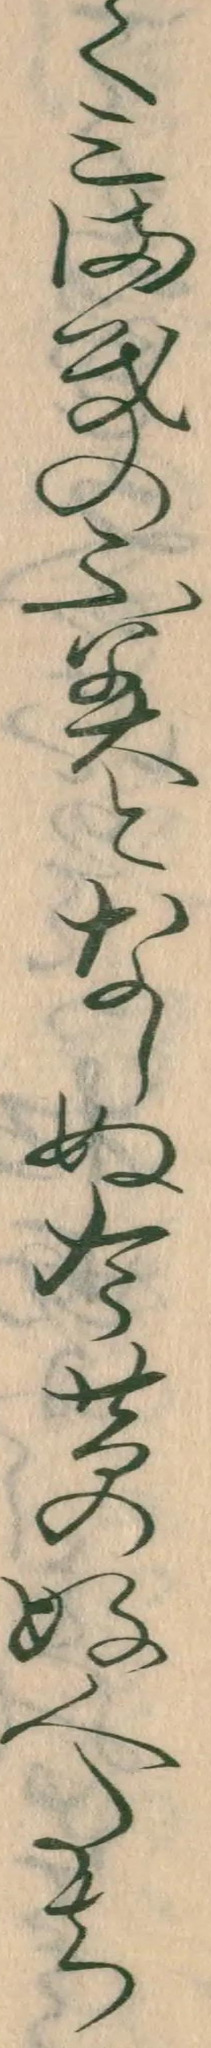く三まきのふみとなしぬ今昔の好人たち
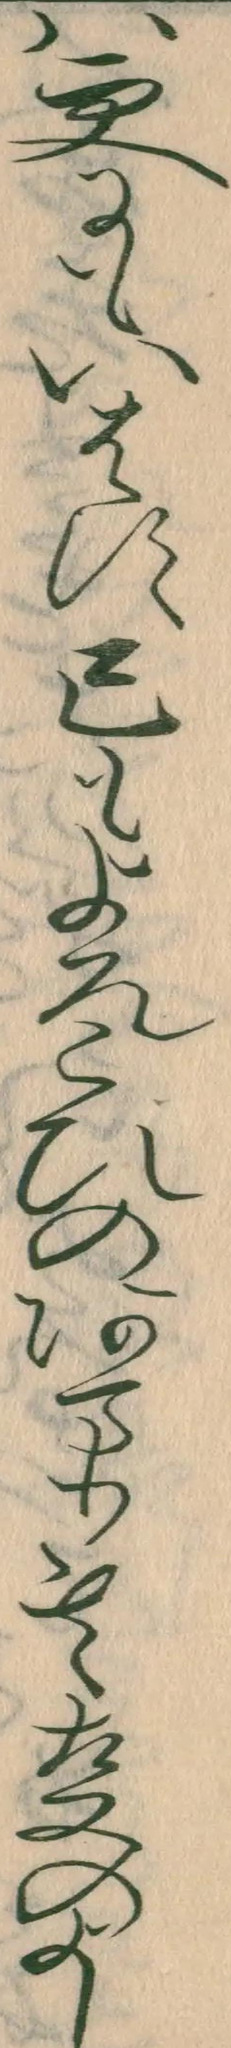は更にもいはす己もよろこひのあまり其事のよし
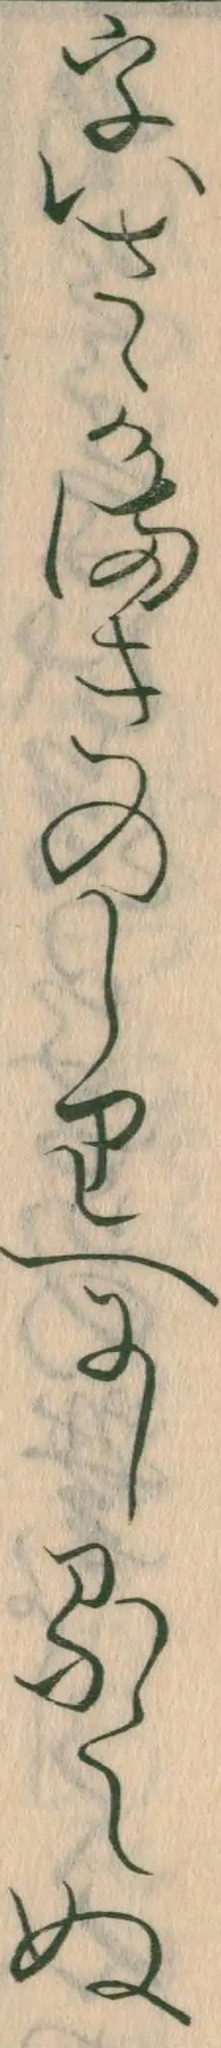をいさゝかまきのしりへにしるしぬ
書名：草木奇品家雅見 3巻. [3]
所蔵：国立国会図書館 National Diet Library, JAPAN
